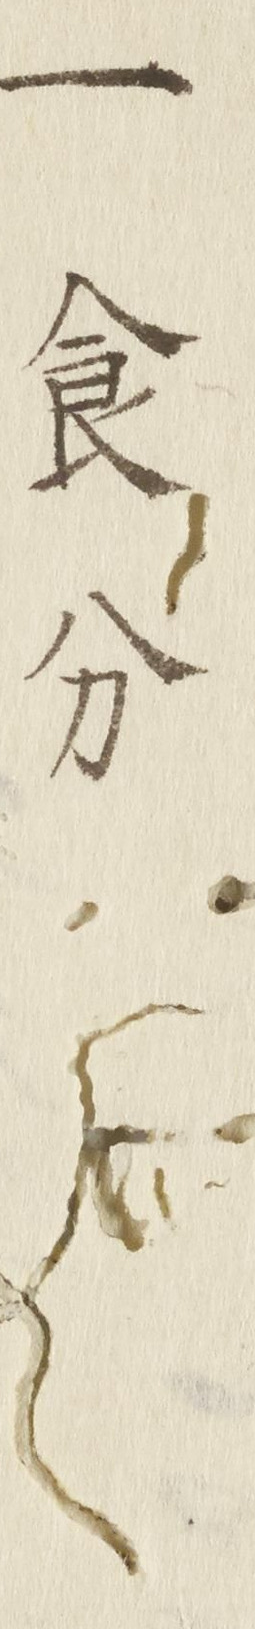一食分
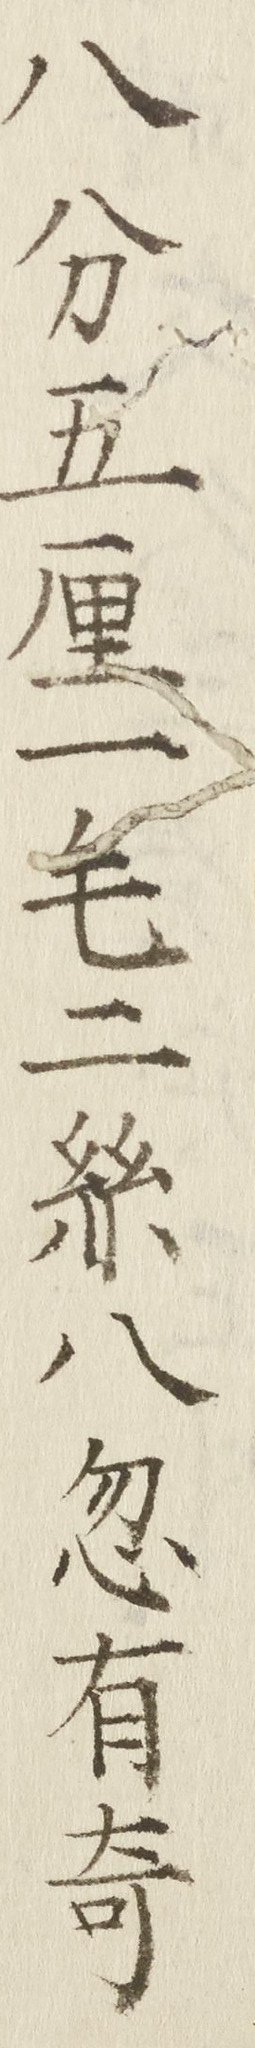八分五厘一毛二糸八忽有奇
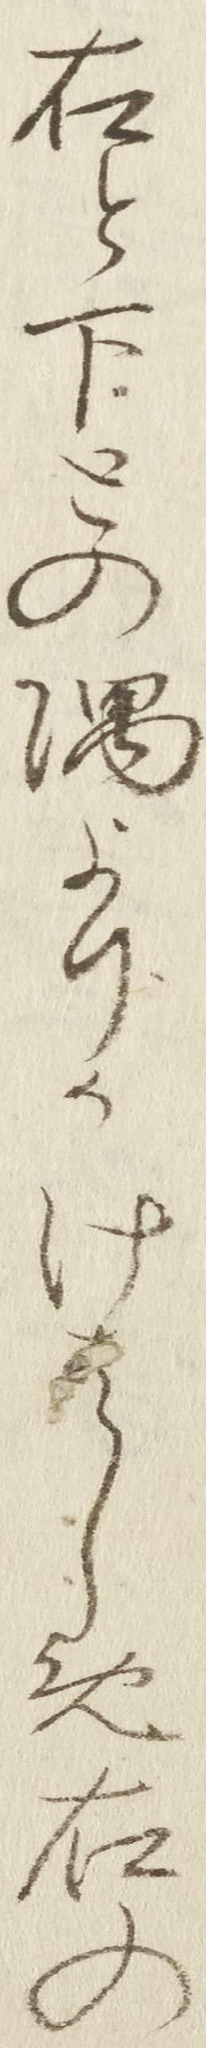右と下との隅よりかけはしめ右の
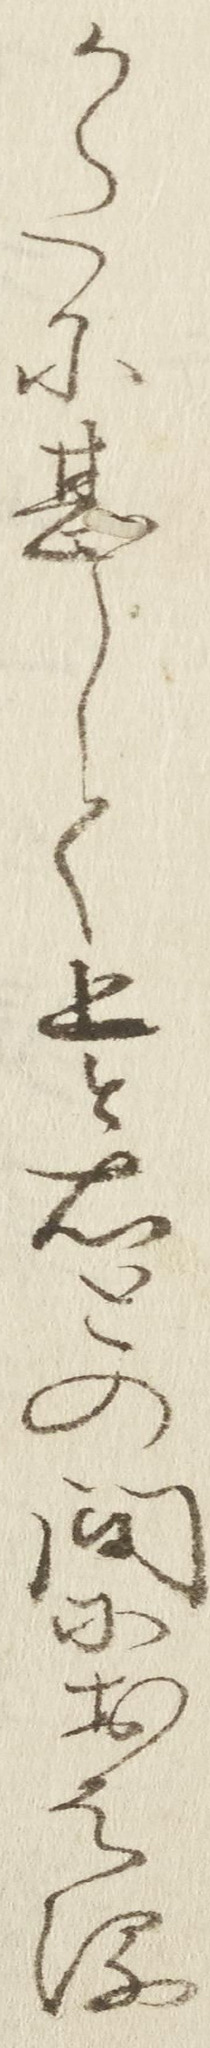とくに甚しく上と左との間におはる

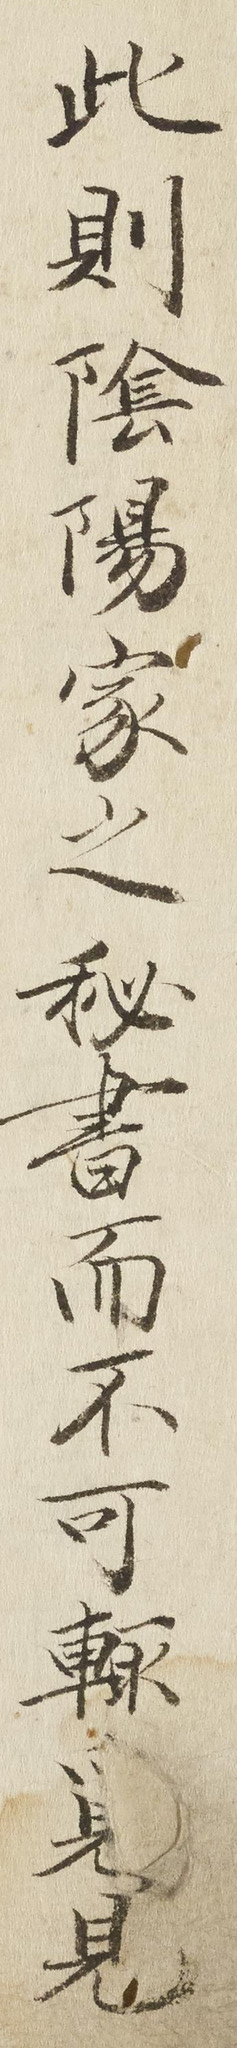此則陰陽家之秘書而不可輙覓？見
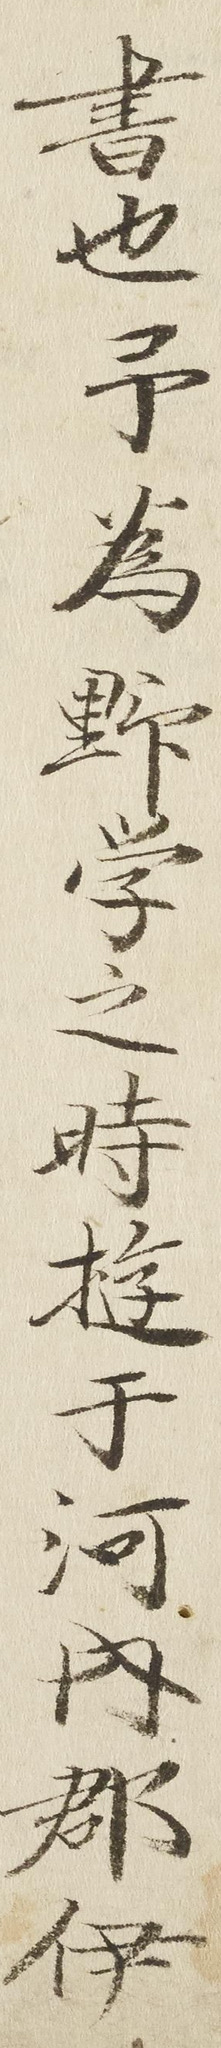書也予為野学之時遊于河内郡伊
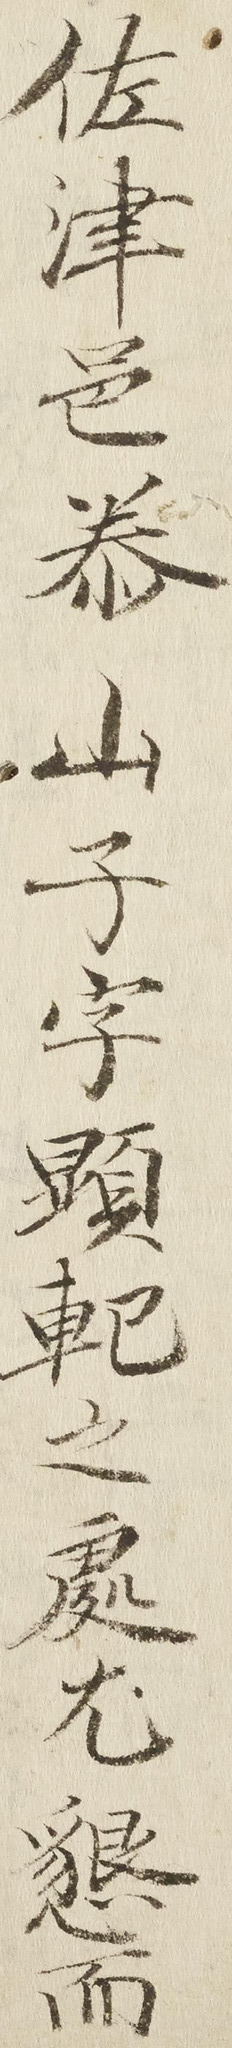佐津邑泰山子字顕𨊠之処尤懇而
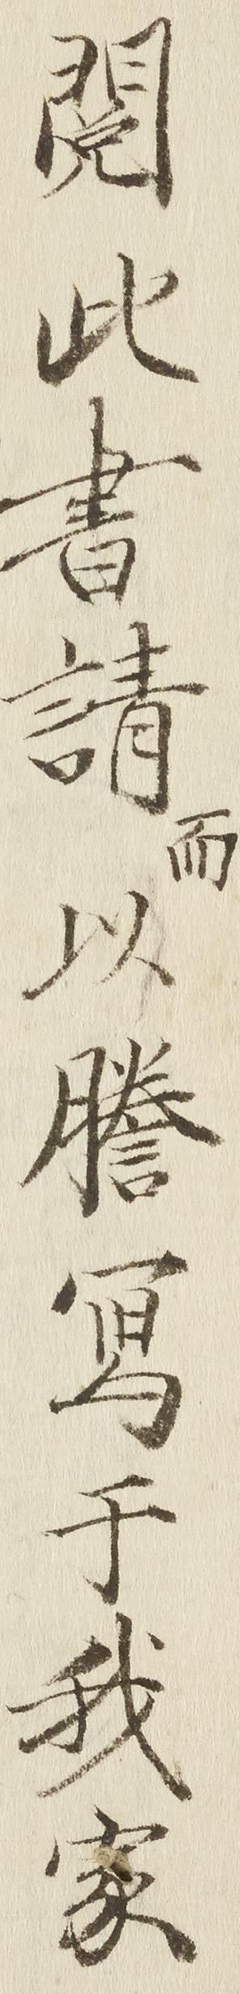閲此書請而以謄写于我家
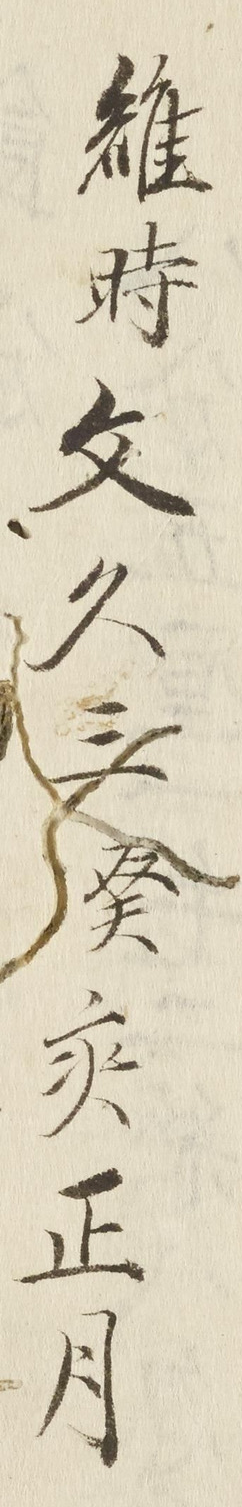維時文久三癸亥年正月
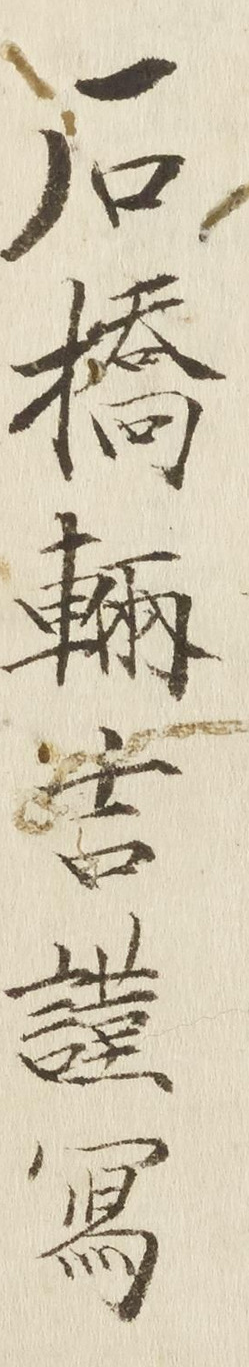石橋輌吉謹写
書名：日食度
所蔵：東京大学地震研究所図書室 Earthquake Research Institute Library, The University of Tokyo, JAPAN
